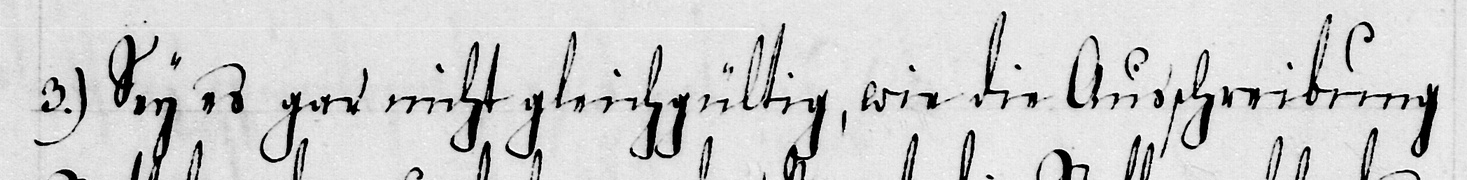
3.) Sey es gar nicht gleichgültig, wie die Ausschreibung
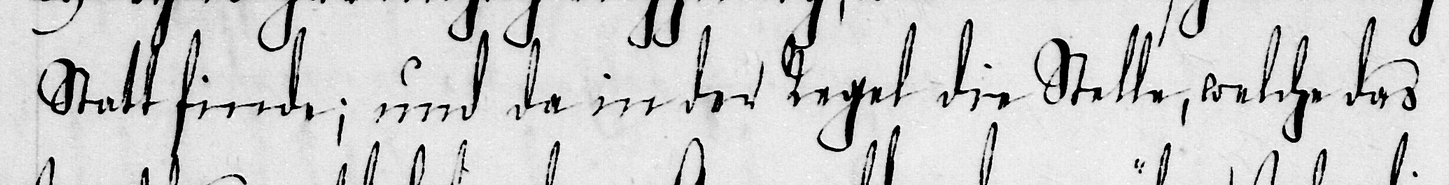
Statt finde, und da in der Regel die Stelle, welche das
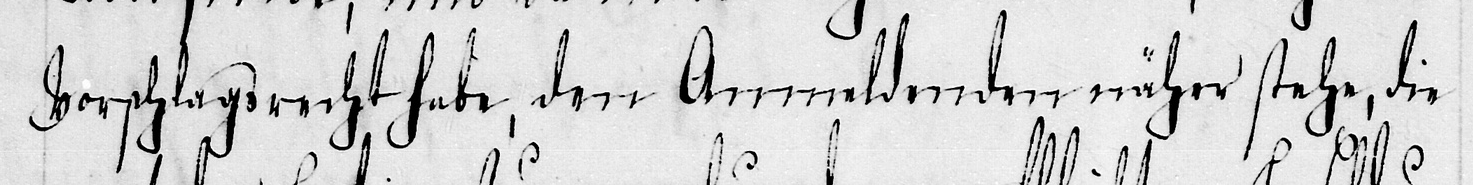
Vorschlagsrecht habe, den Anmeldenden näher stehe, die
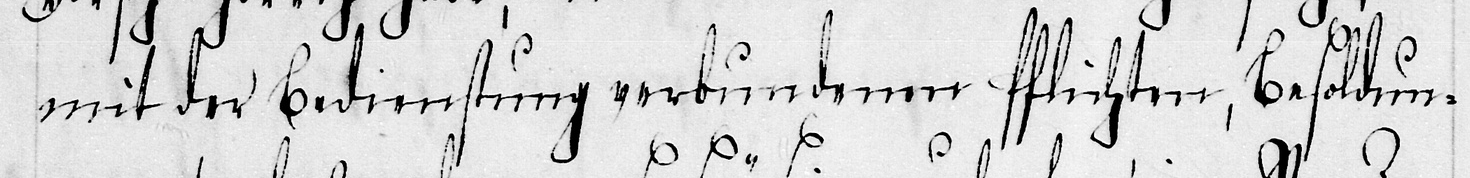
mit der Bedienstung verbundenen Pflichten, Besoldun¬
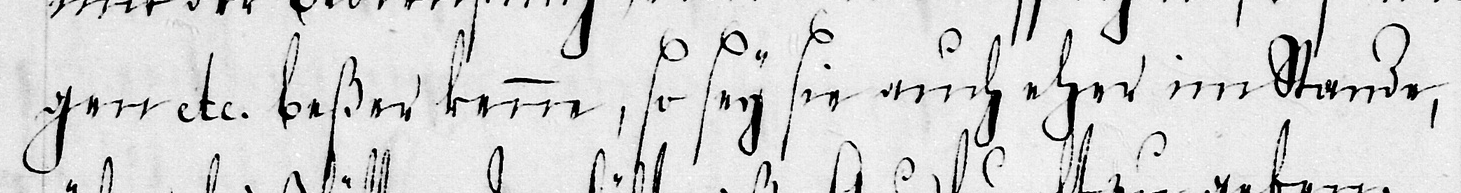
gen etc. beßer kenne, so sey sie auch eher im Stande,
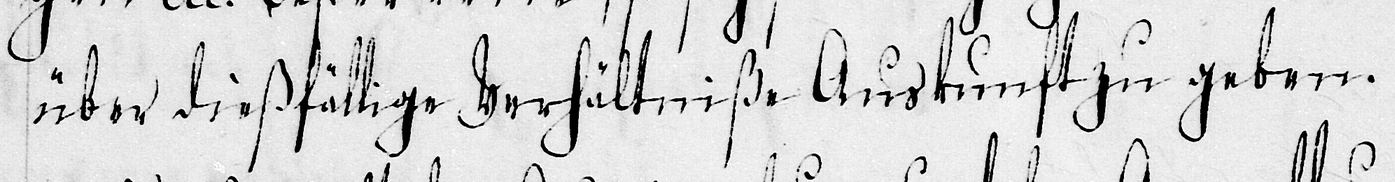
über dießfällige Verhältniße Auskunft zu geben.
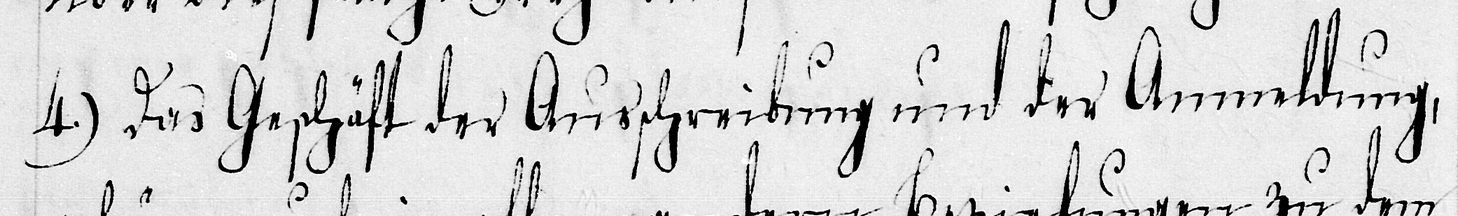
4.) Das Geschäft der Ausschreibung und der Anmeldung,
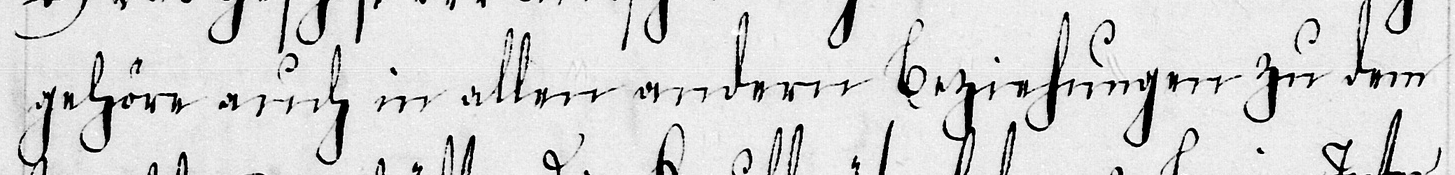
gehöre auch in allen andern Beziehungen zu dem
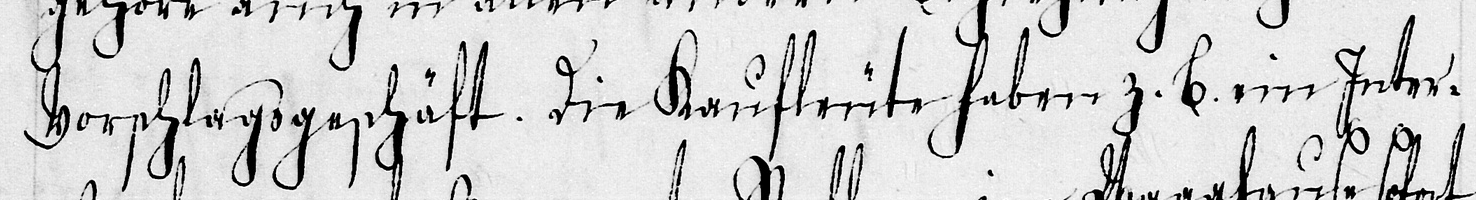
Vorschlagsgeschäft. Die Kaufleute haben z. B. ein Inter¬
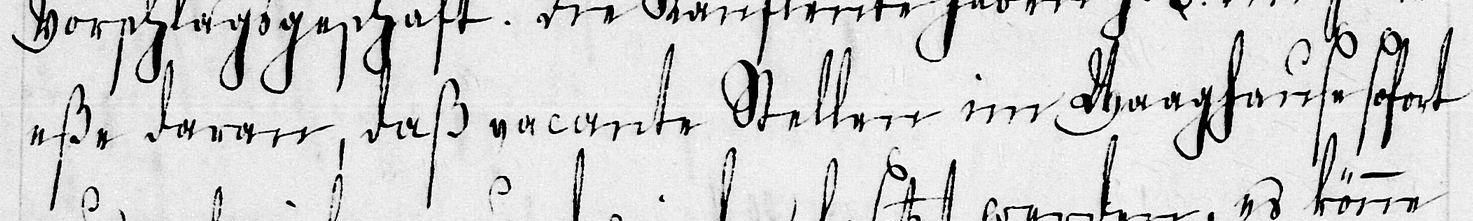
eße daran, daß vacante Stellen im Waaghause sofort
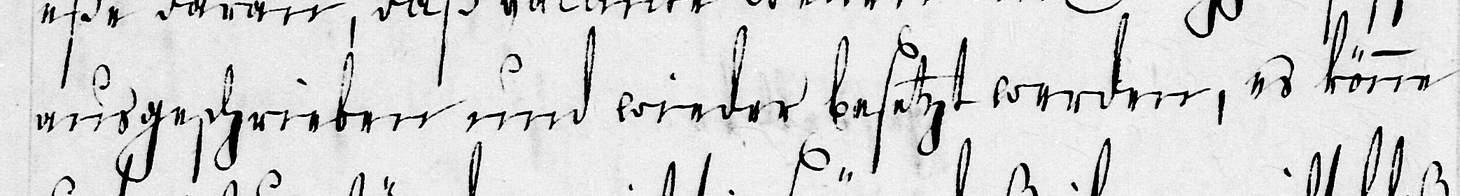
ausgeschrieben und wieder besetzt werden, es könne
